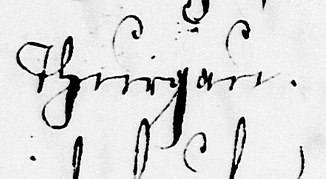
Thurgau.
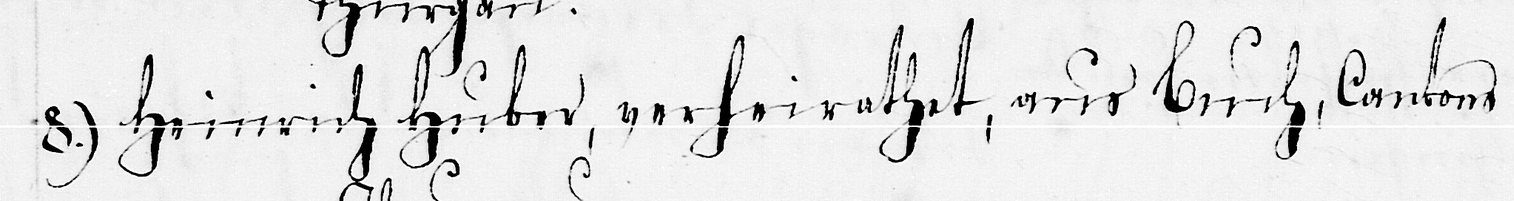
8.) Heinrich Huber, verheirathet, aus Buch, Cantons
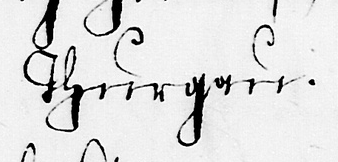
Thurgau.
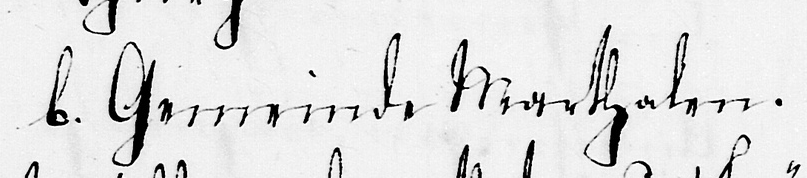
b. Gemeinde Marthalen.
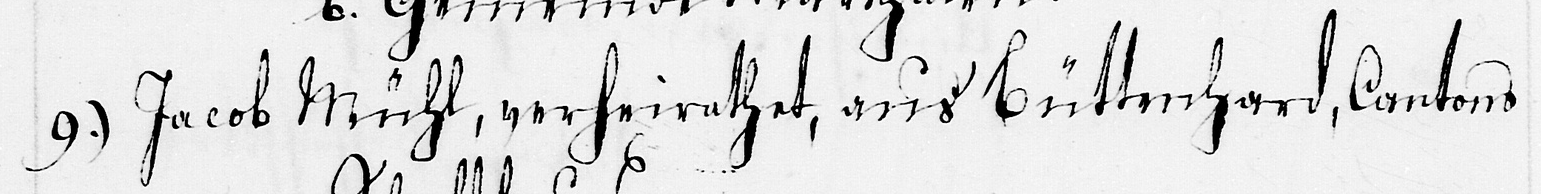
9.) Jacob Mühl, verheirathet, aus Büttenhard, Cantons
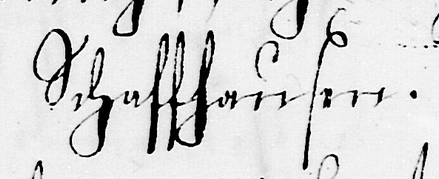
Schaffhausen.
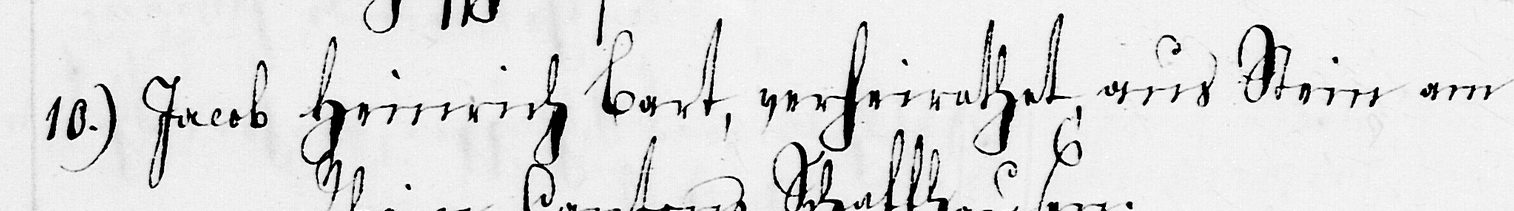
10.) Jacob Heinrich Bart, verheirathet, aus Stein am
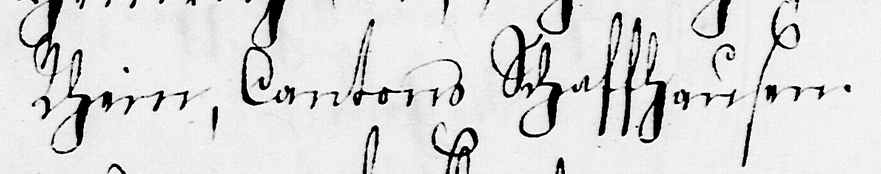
Rhein, Cantons Schaffhausen.
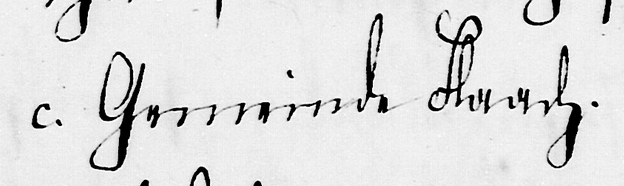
c. Gemeinde Flaach.
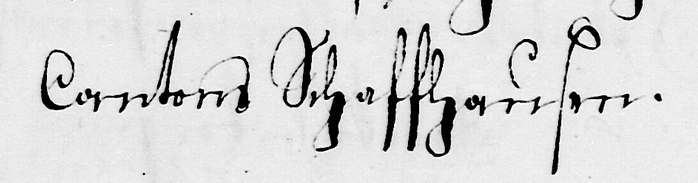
Cantons Schaffhausen.
